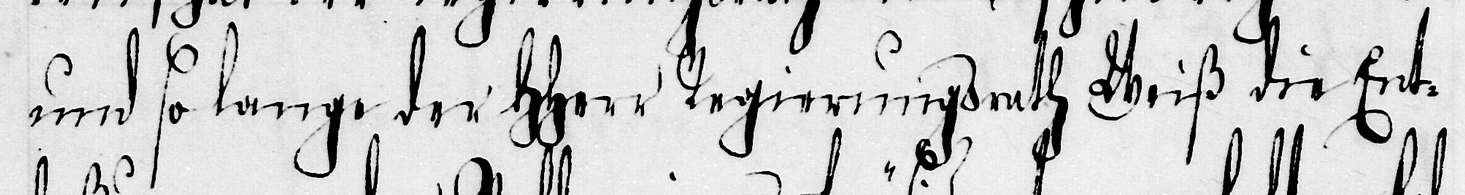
und so lange der HHerr Regierungsrath Weiß die Ent¬
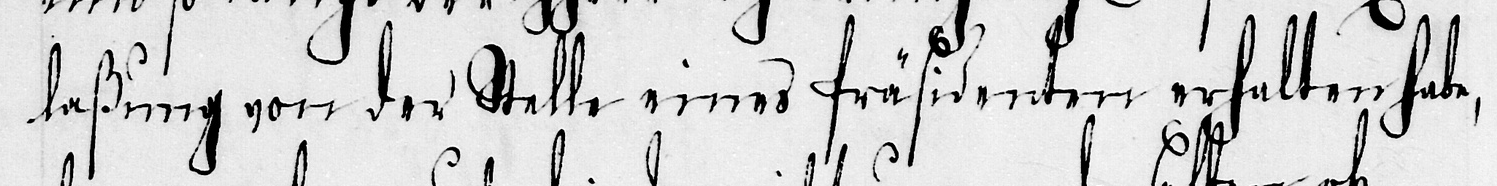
laßung von der Stelle eines Präsidenten erhalten habe,
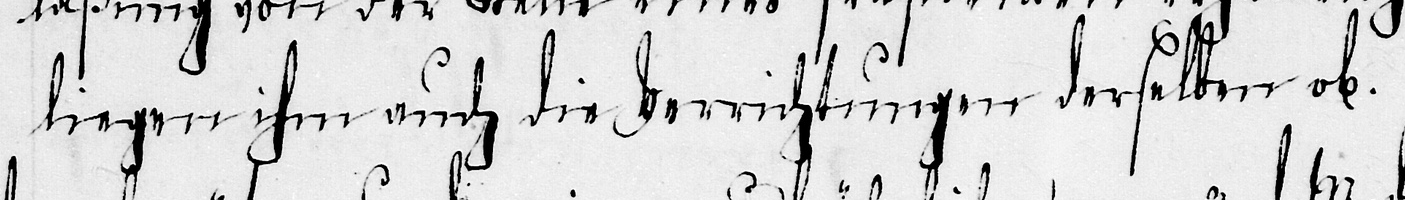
liegen ihm auch die Verrichtungen derselben ob.
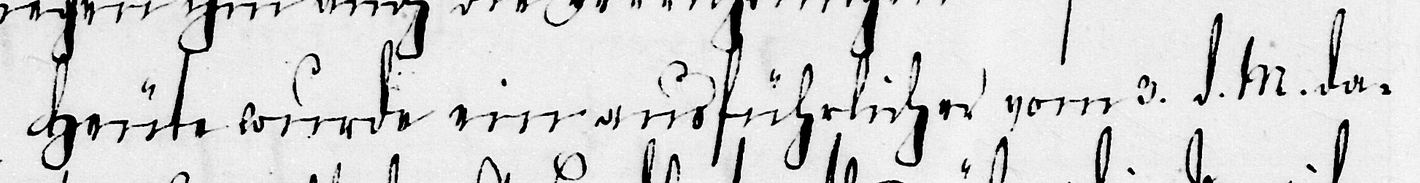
Heute wurde ein ausführlicher vom 3. d. M. da¬
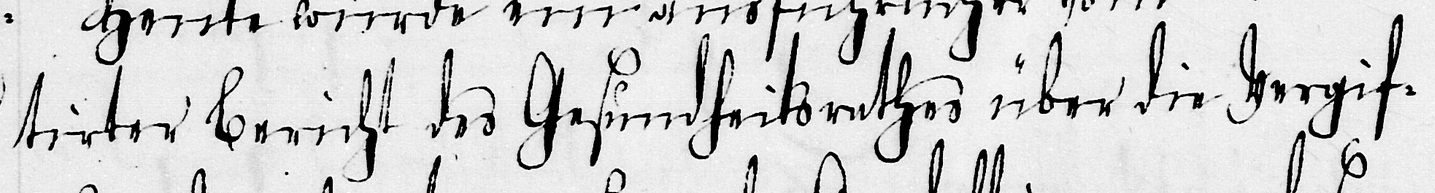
tirter Bericht des Gesundheitsrathes über die Vergif¬
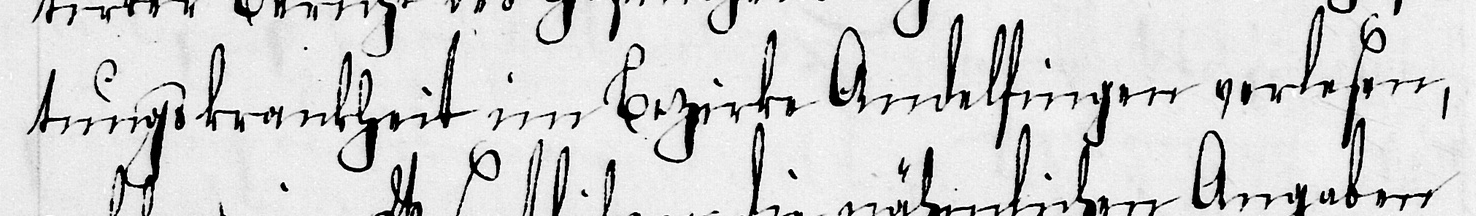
tungskrankheit im Bezirke Andelfingen verlesen,
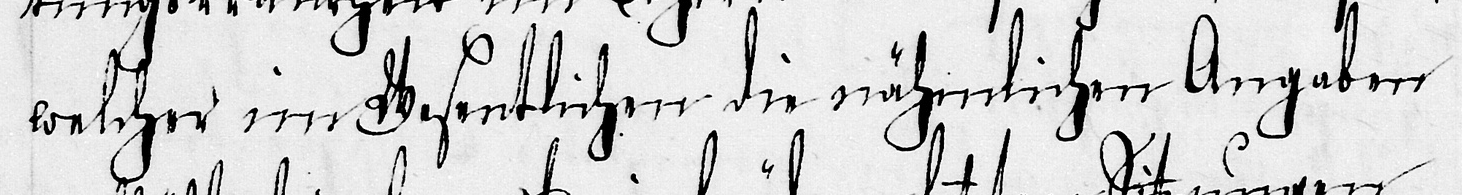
welcher im Wesentlichen die nähmlichen Angaben
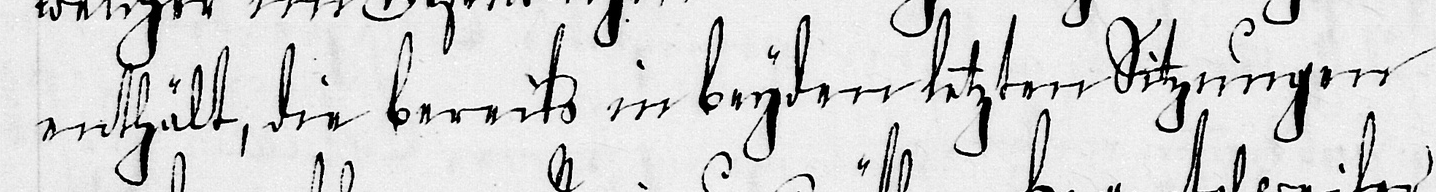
enthält, die bereits in beyden letzten Sitzungen
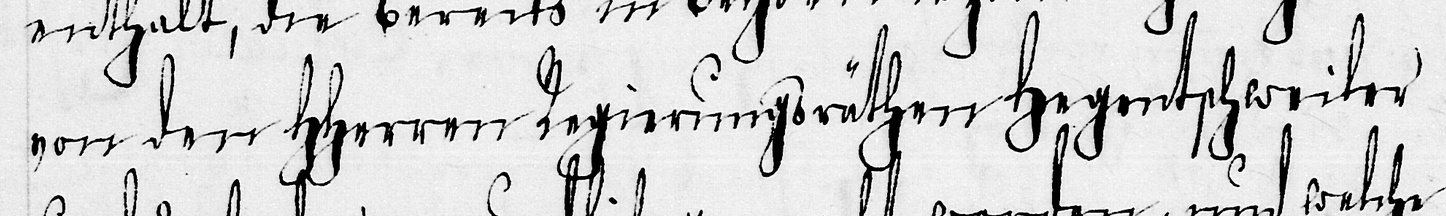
von den HHerren Regierungsräthen Hegentschweiler
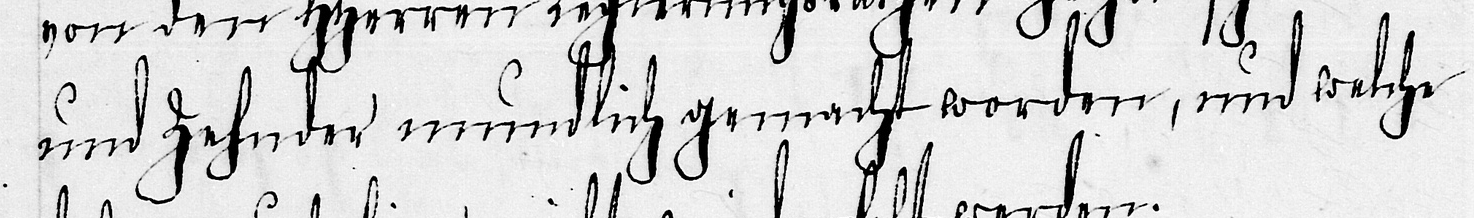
und Zehnder mundlich gemacht worden, und welche
